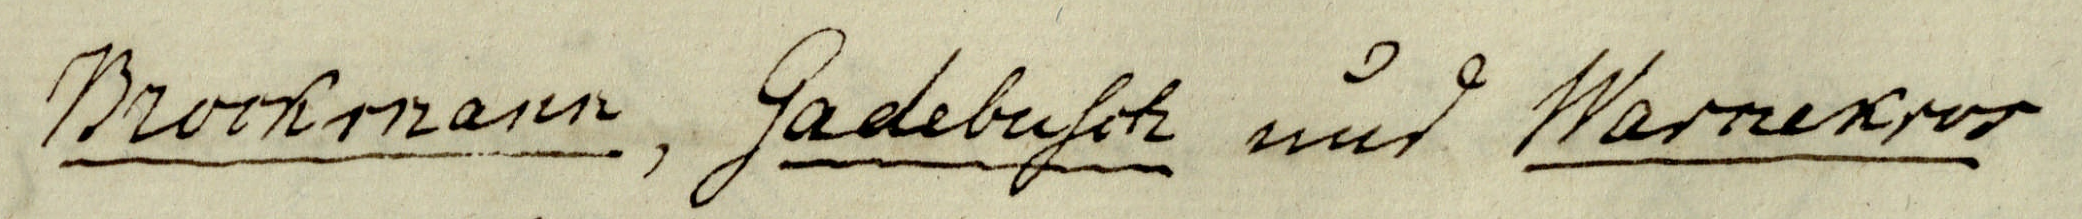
Brockmann, Gadebusch und Warnekros
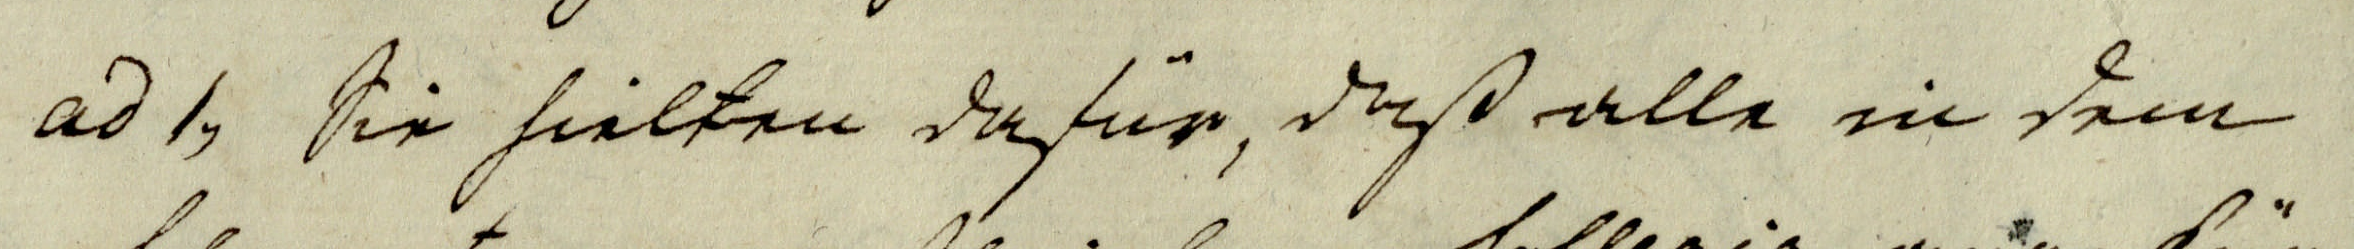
ad 1., Sie hielten dafür, daß alle in dem
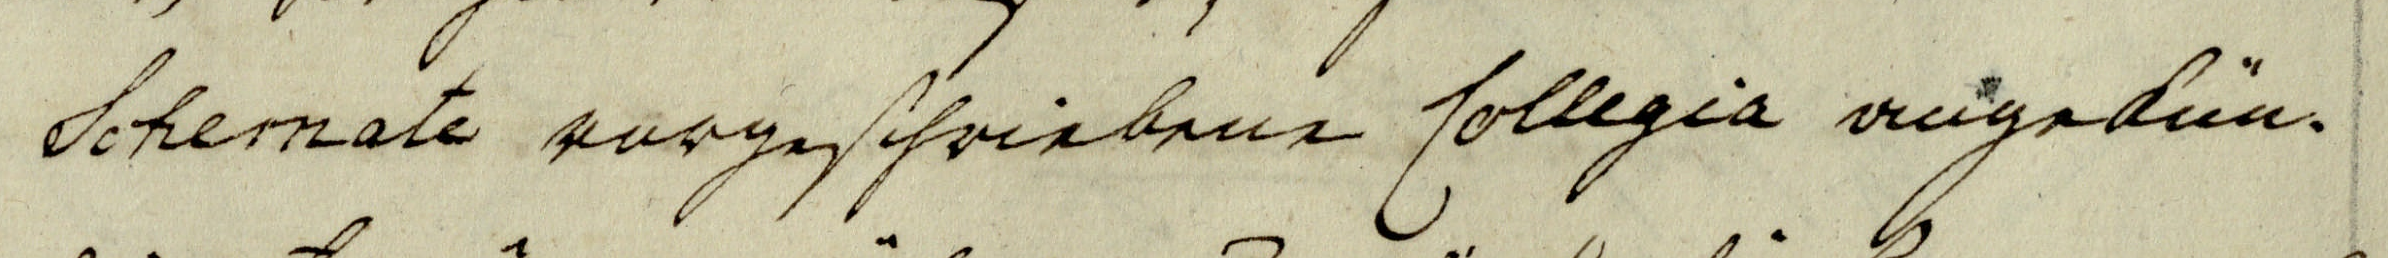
Schemate vorgeschriebene Collegia angekün¬
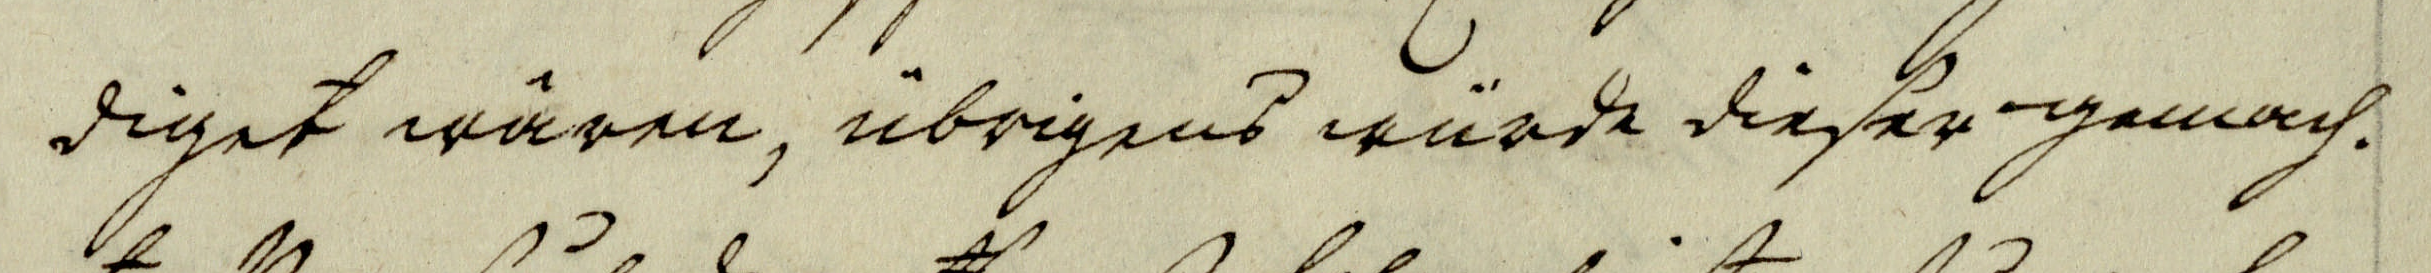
diget wären, übrigens würde dieser gemach¬
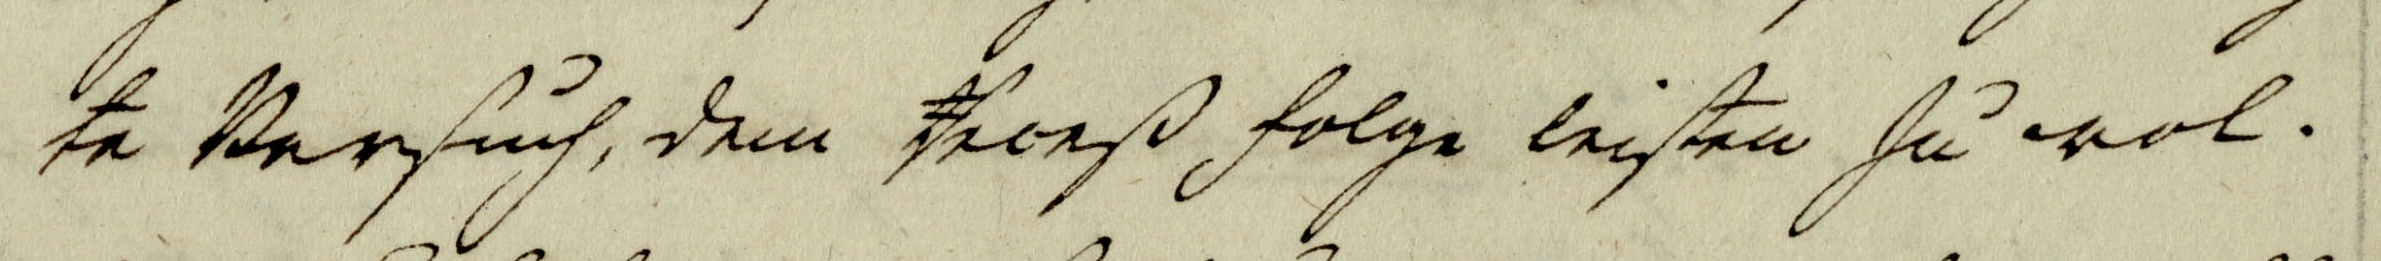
te Versuch, dem Receß Folge leisten zu wol-
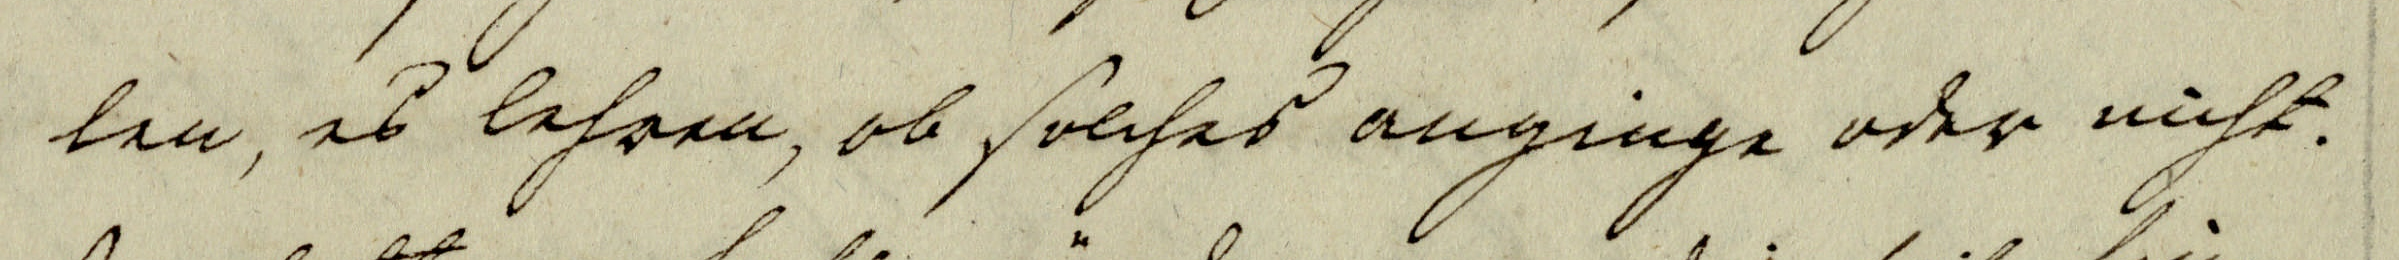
len, es lehren, ob solches anginge oder nicht.
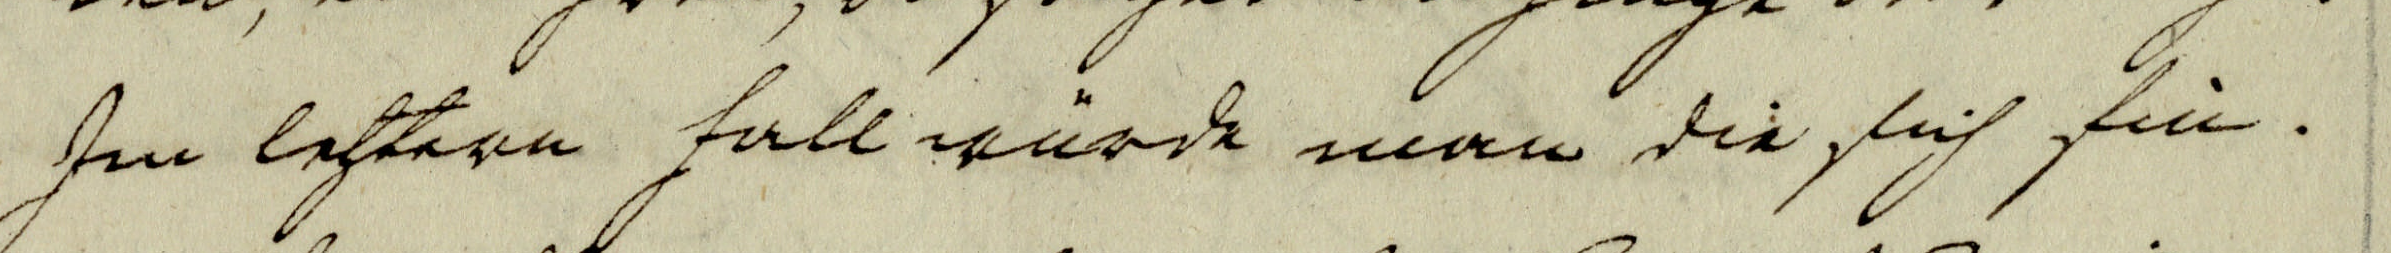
Im letztern Fall würde man die sich fin¬
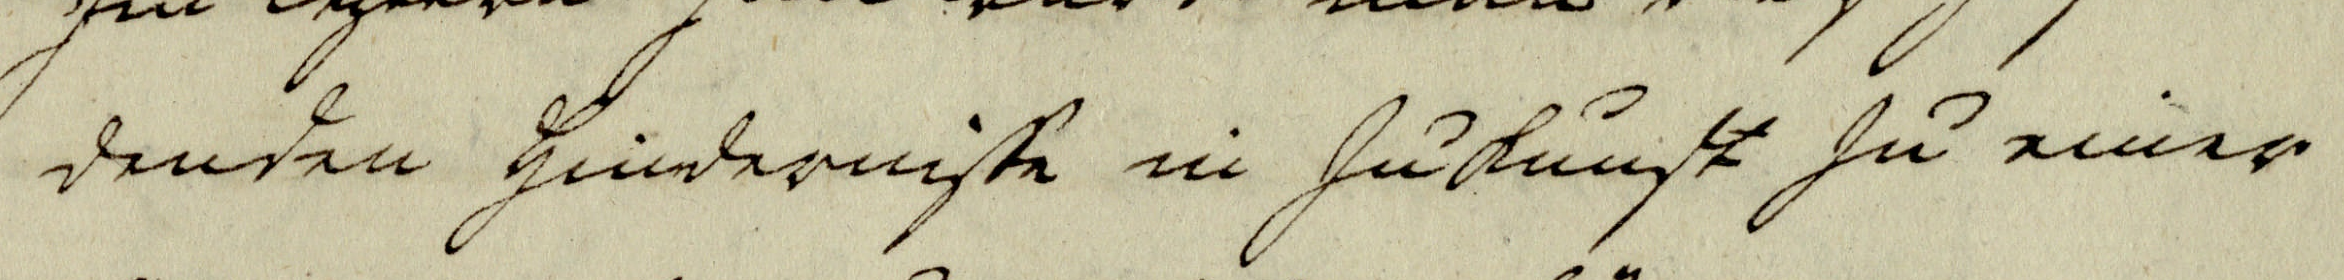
denden Hindernisse in Zukunft zu einer
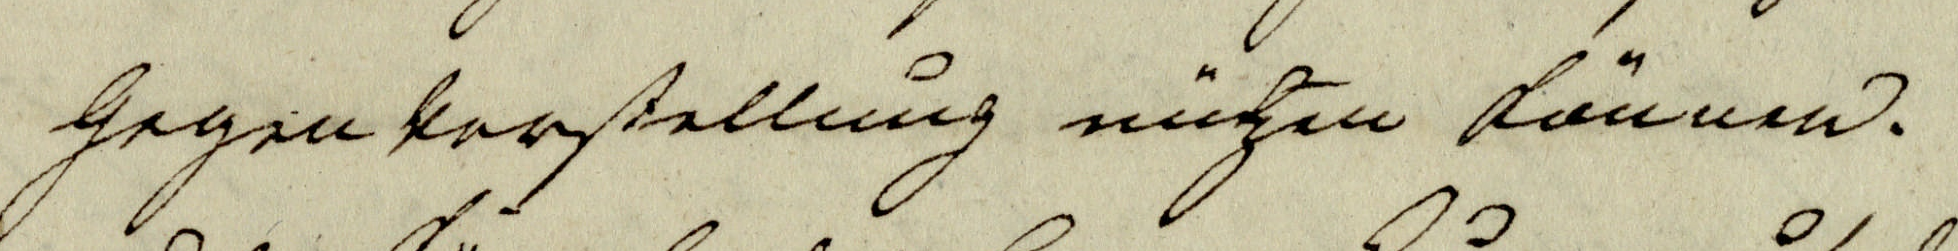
Gegen Vorstellung nützen können.
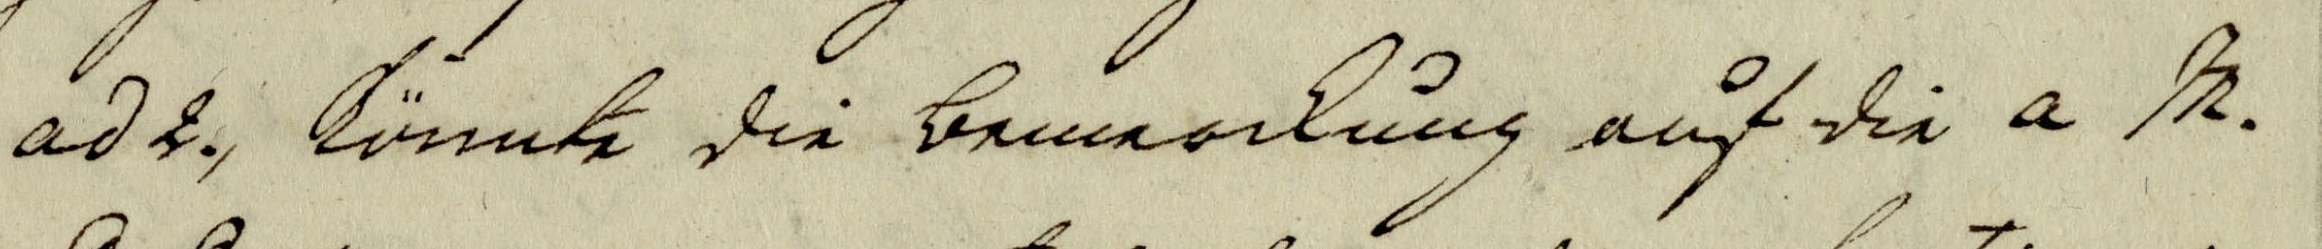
ad 2. Könnte die Bemerckung auf die a M.
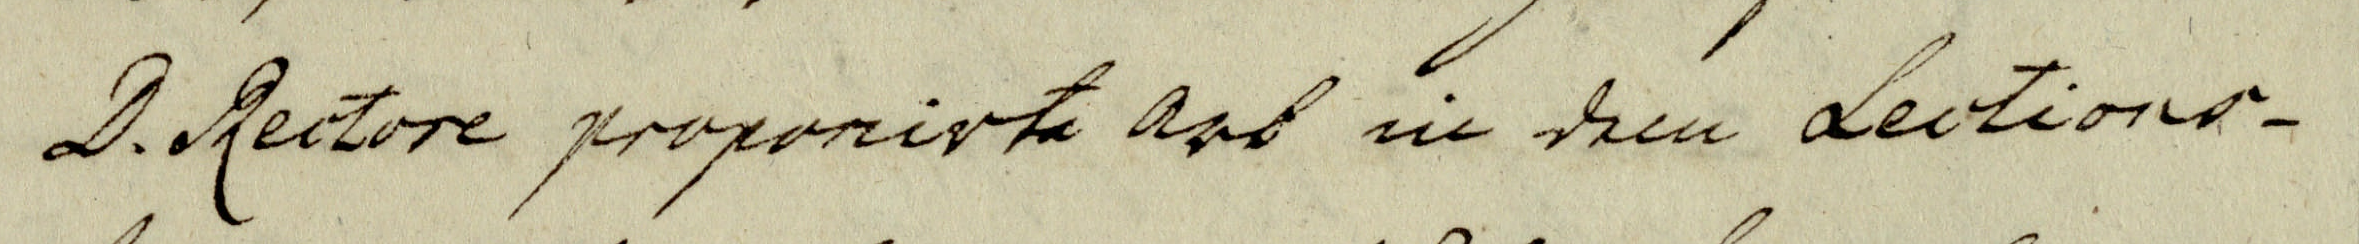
D. Rectore proponirte Art in dem Lections¬
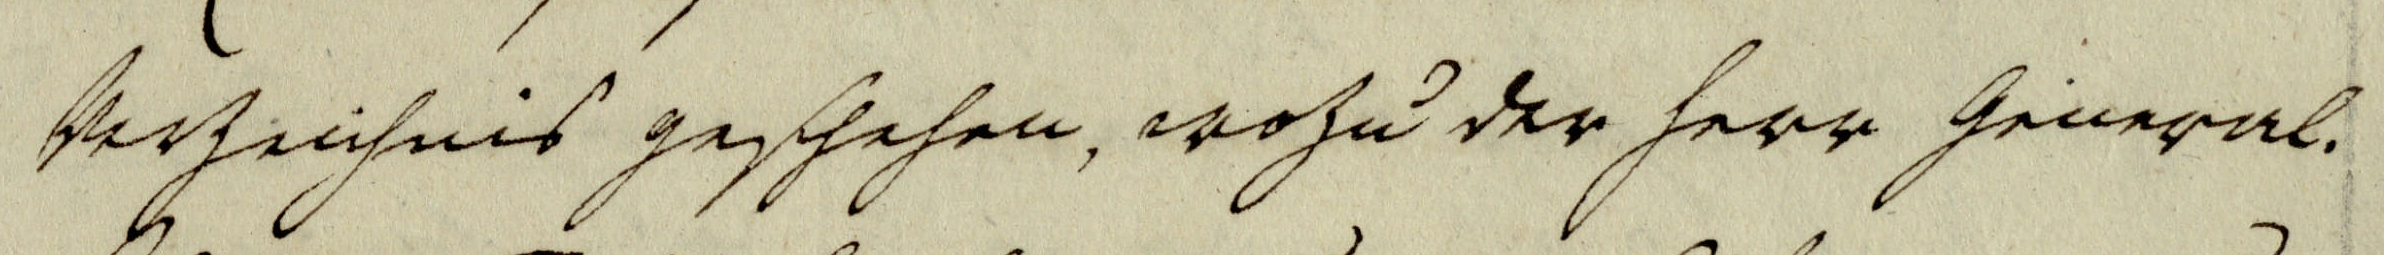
Verzeichnis geschehen, wozu der Herr General¬
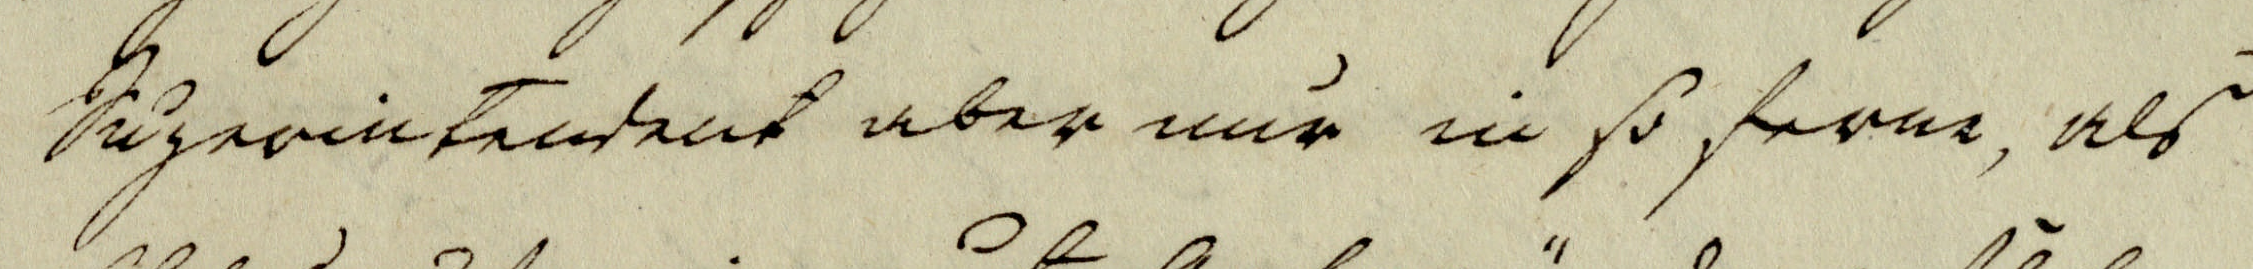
Superintendent aber nur in so ferne, als
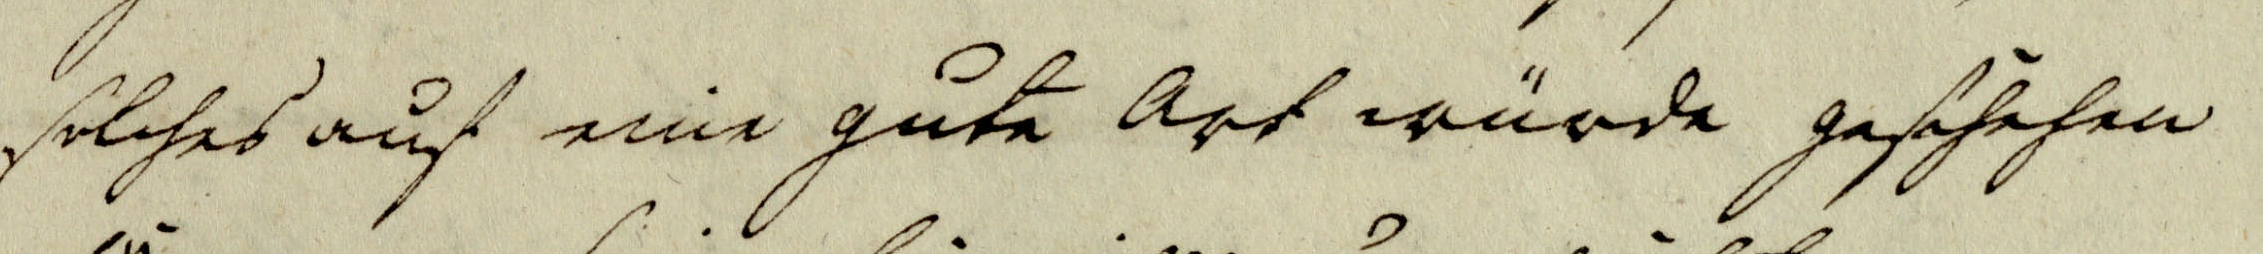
solches auf eine gute Art würde geschehen
